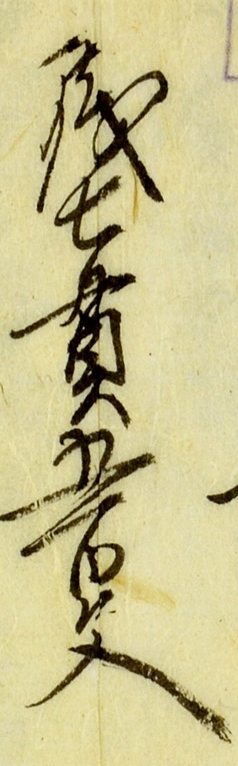銭七貫五百文
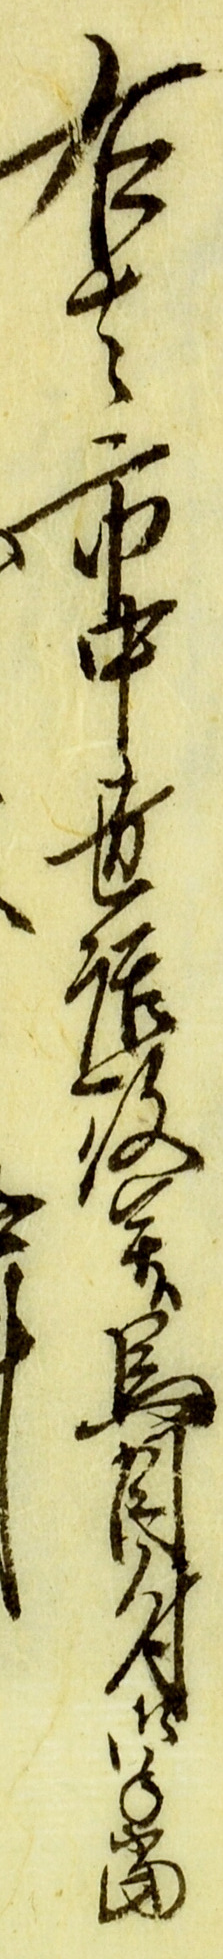右者市中世話役並馬目付御手当
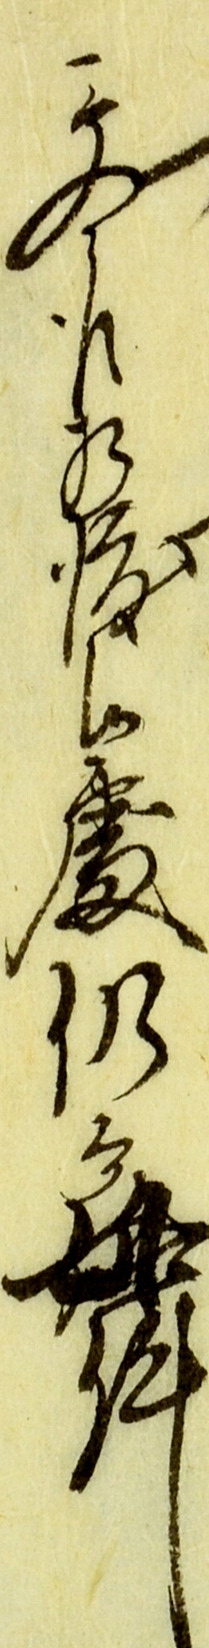受取相渡候処仍而如件

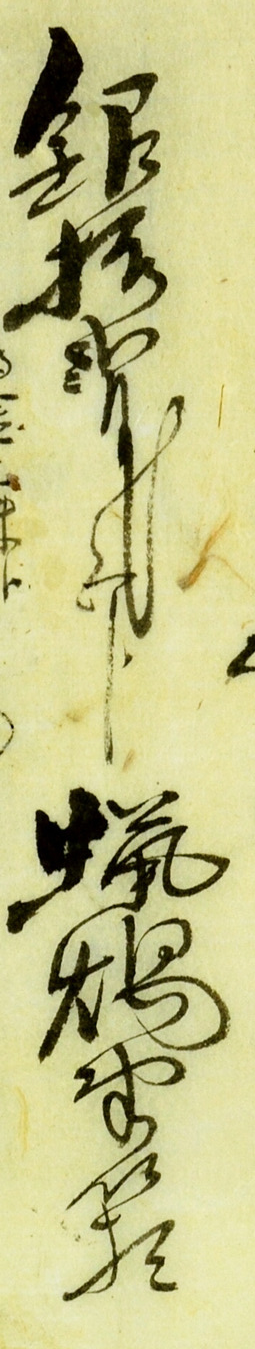銀拾弐匁五分蝋燭半箱
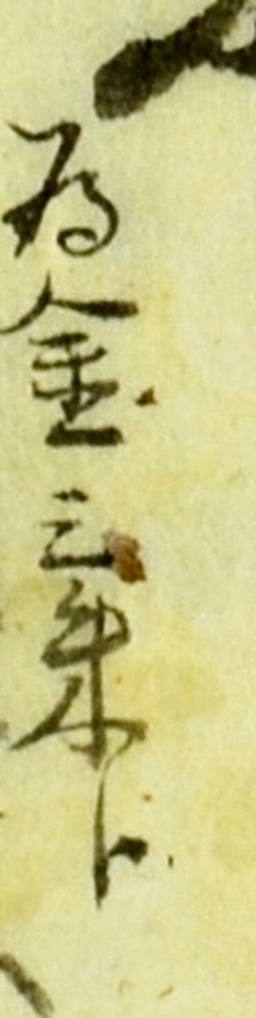為金三朱ト
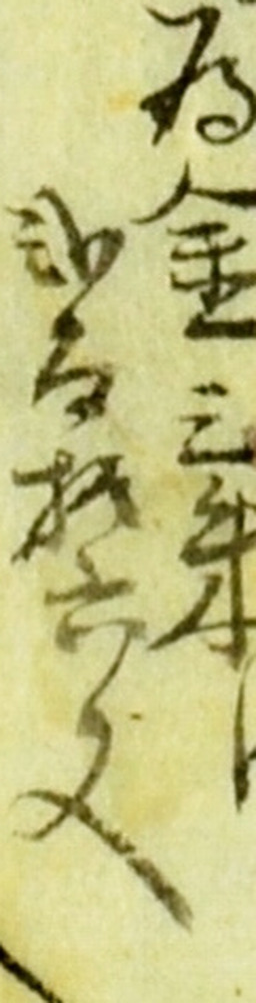弐百拾六文
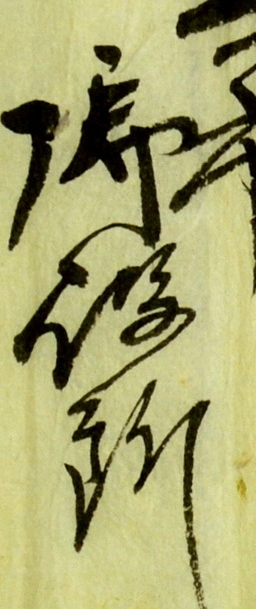御役所

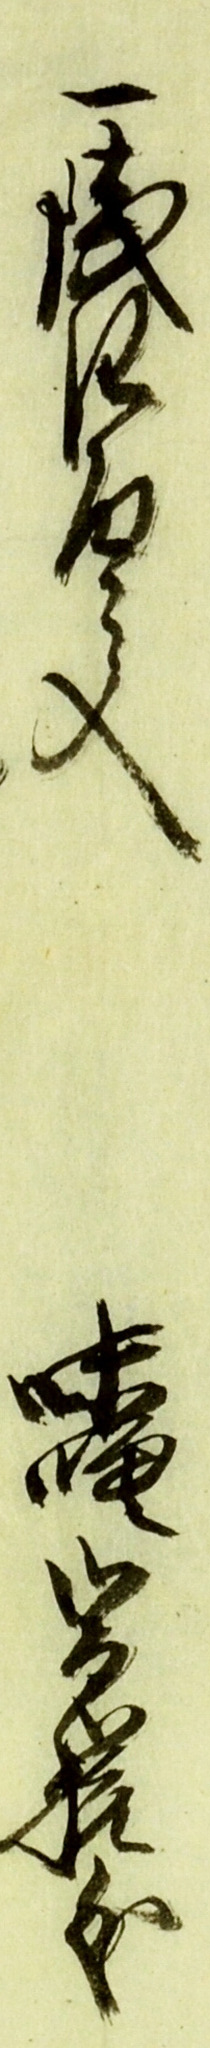一銭四百文味噌弐百弐拾匁
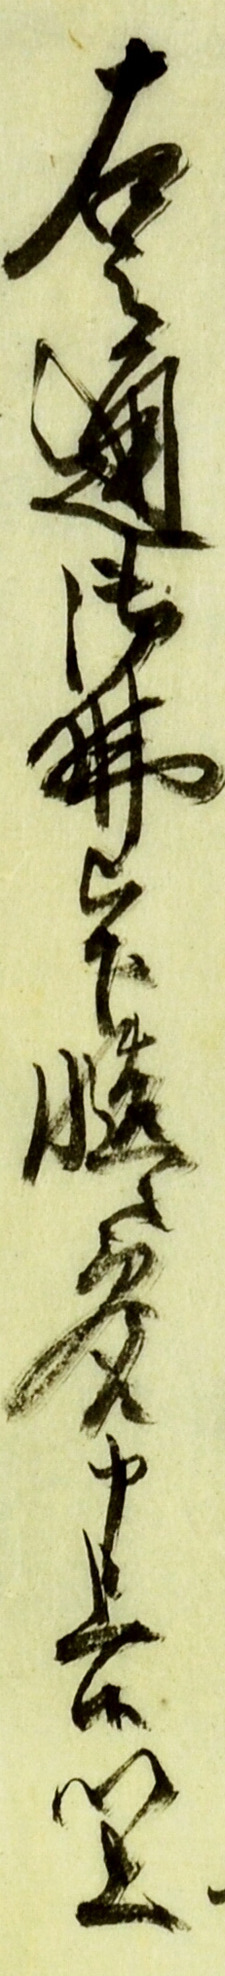右之通御払被下慥ニ受取申上候以上
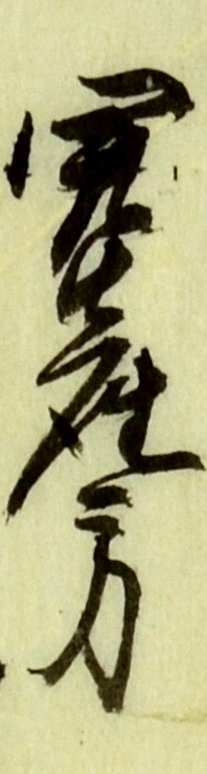開産方
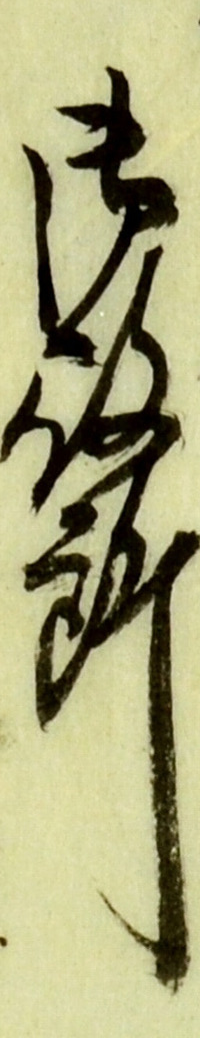御役所

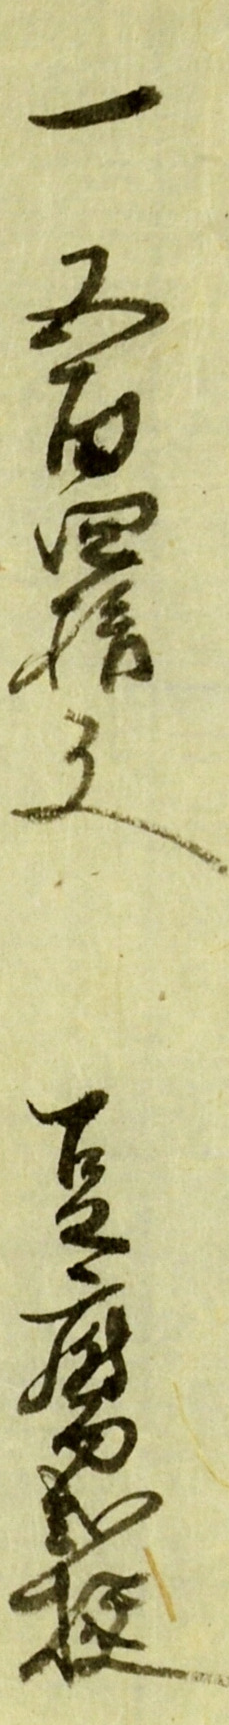一五百四拾文豆腐弐挺
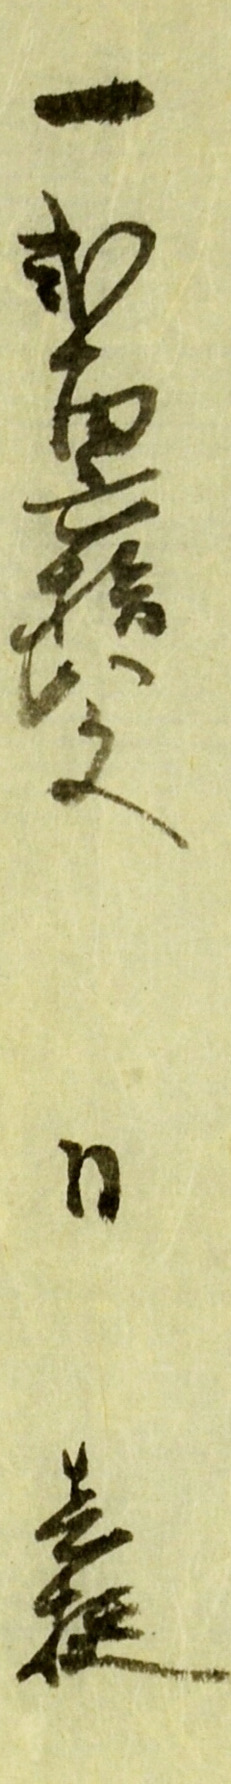一弐百六拾八文同壱挺
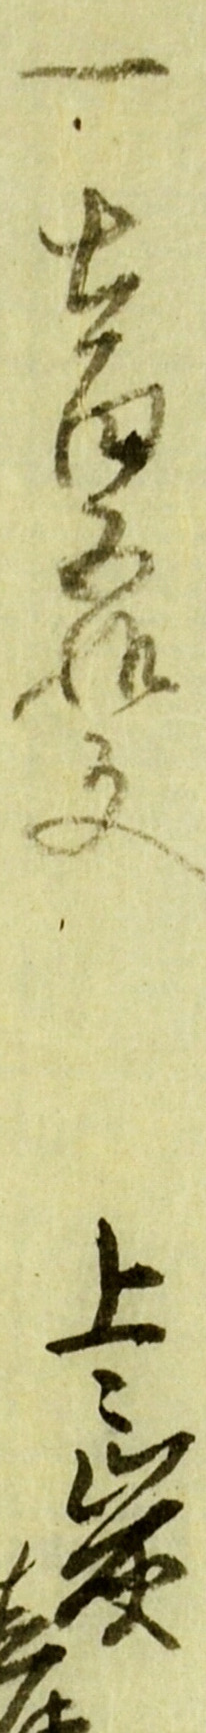一七百五拾文上々炭壱俵
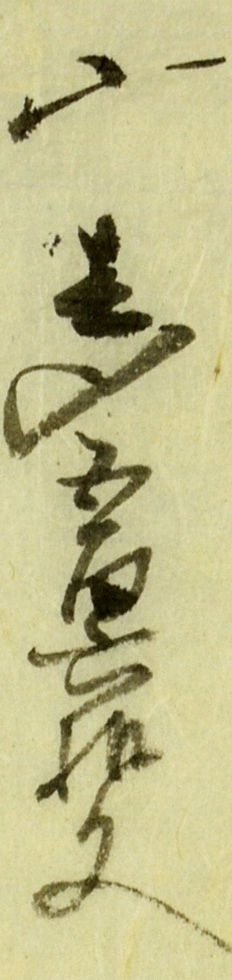〆壱貫五百六拾文
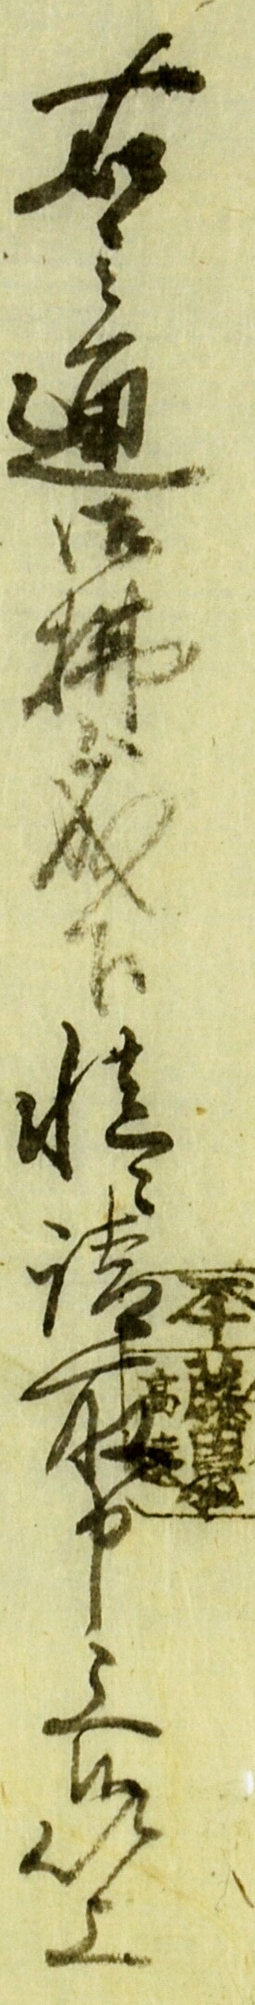右之通御払被成下慥ニ請取申上候以上
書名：記
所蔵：伊那市立高遠町図書館・合同会社AMANE
